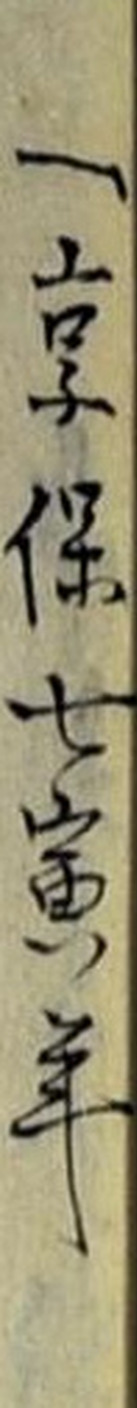一享保七寅年
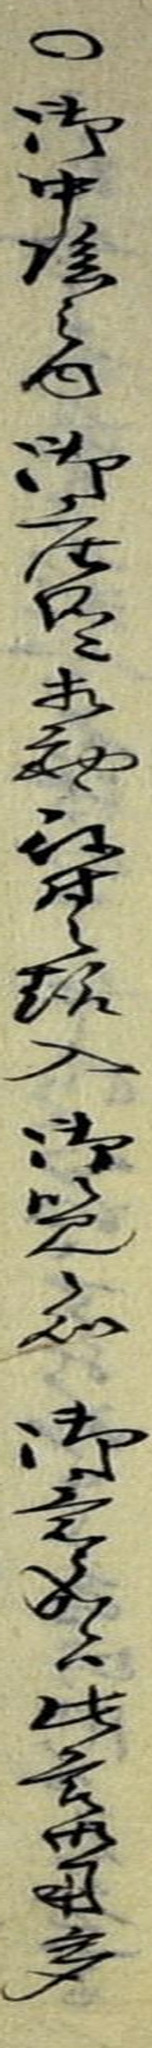〇御中陰之内御座所ニ相勤候役付之趣入御覧候処御意被成候ハ此節御用多
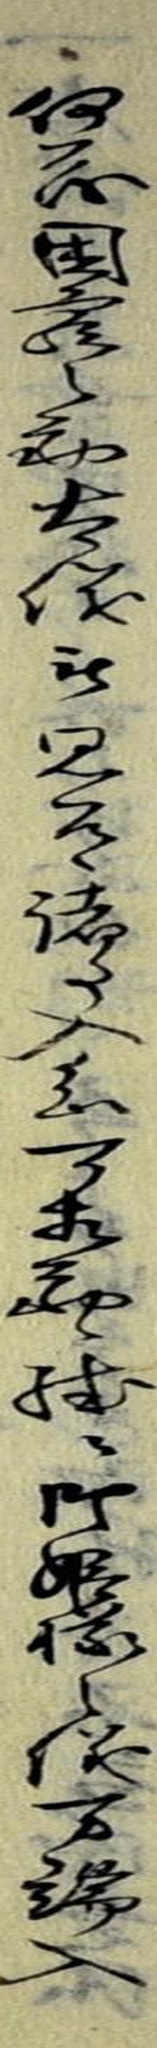何茂困窮之勤太儀被思召候諸事入念可相勤候殊ニ御姫様之儀万端入
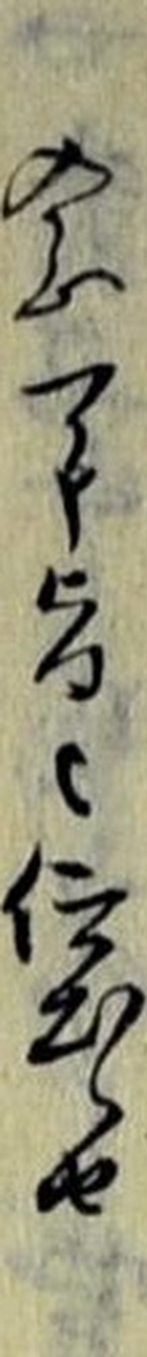念可申旨被仰出候由
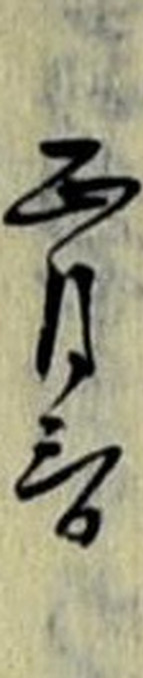正月三日
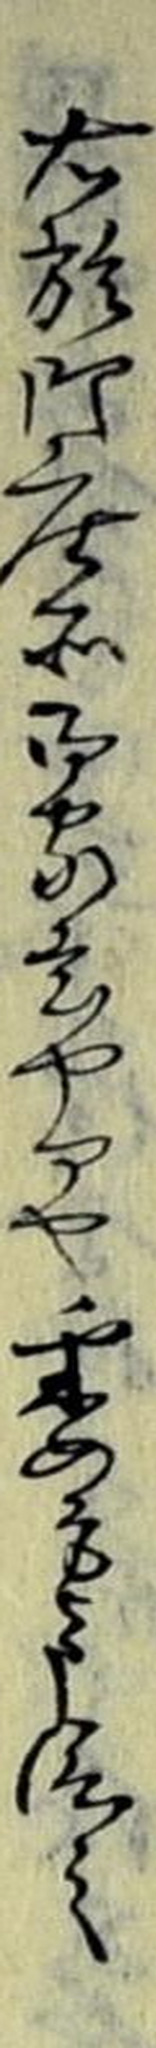右於御座所御家老中部屋采女方被申渡之
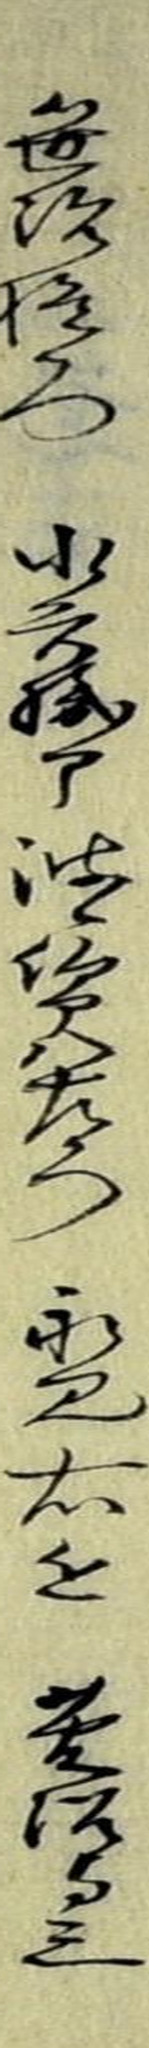笹治権右衛門水谷織部波々伯部八左衛門永見右近菅沼与三
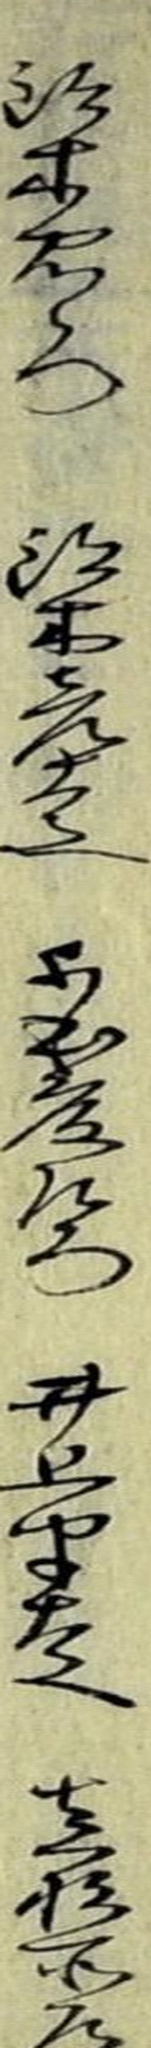鈴木忠右衛門鈴木彦大夫千本藤左衛門井上半大夫真杉所左衛門
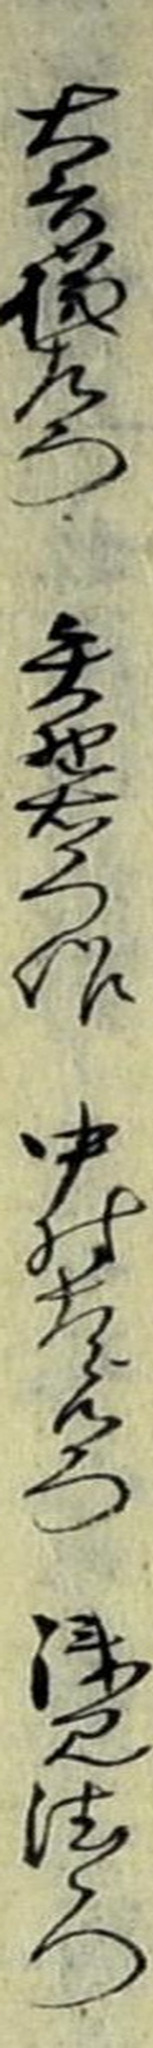大谷儀左衛門矢野右衛門作中村太郎左衛門浅見徳右衛門
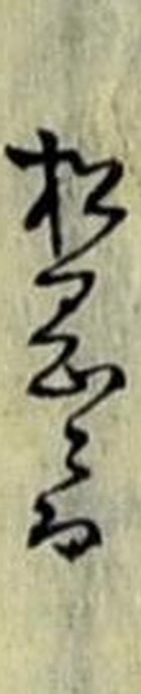松岡ニ而
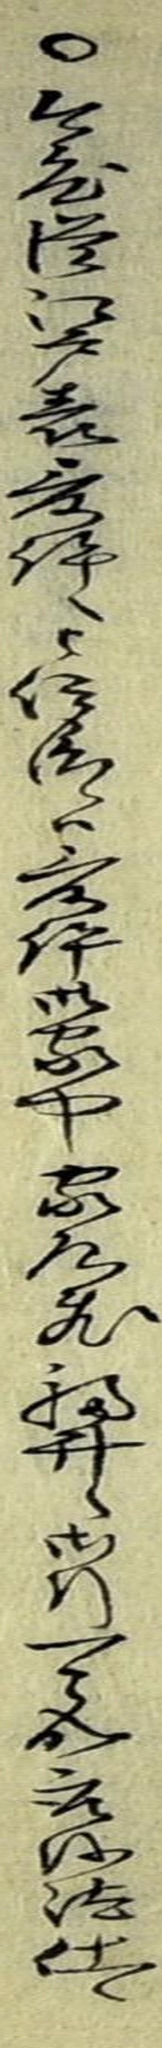〇今度従江戸表爰許へ被仰渡候ハ爰許御家中家屋敷福井へ御引可被成取沙汰仕候
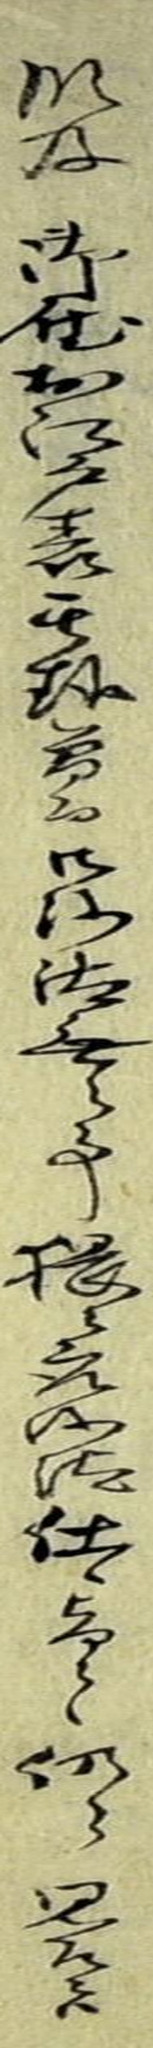段及御聴於江戸表其趣曽而御沙汰無之事猥ニ取沙汰仕候旨ニ候仍之思召ニハ
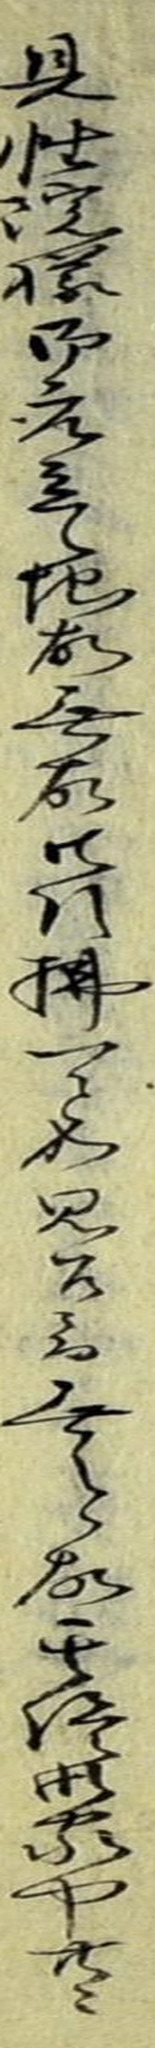見性院様御取立之地故無故御引払可被成思召ニ而無之候故其儘御家中共々
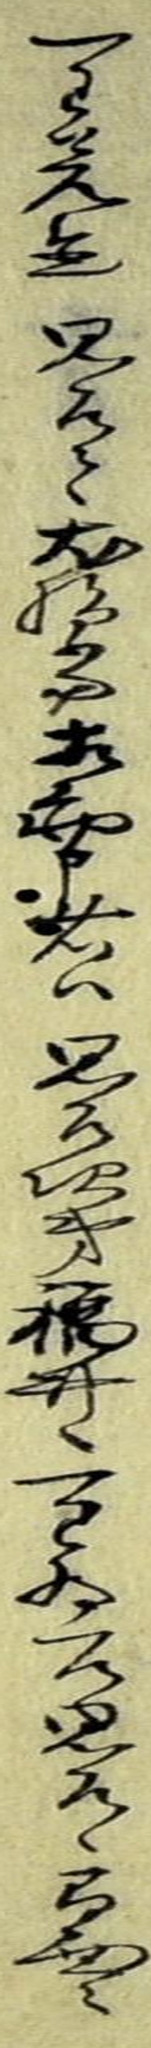可被差置思召ニ候尤指当相勤申者ハ思召次第福井へ可被為召思召候間面々
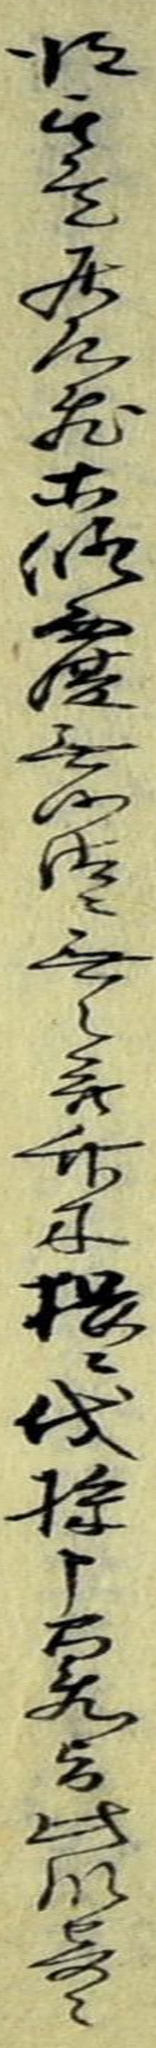得其意居屋敷等修覆無沙汰ニ無之并竹木猥ニ伐採申間敷旨此段寄々

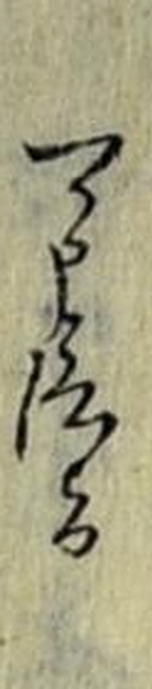可申渡旨
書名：命令之部 一
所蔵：福井県文書館 Fukui Prefectural Archives
